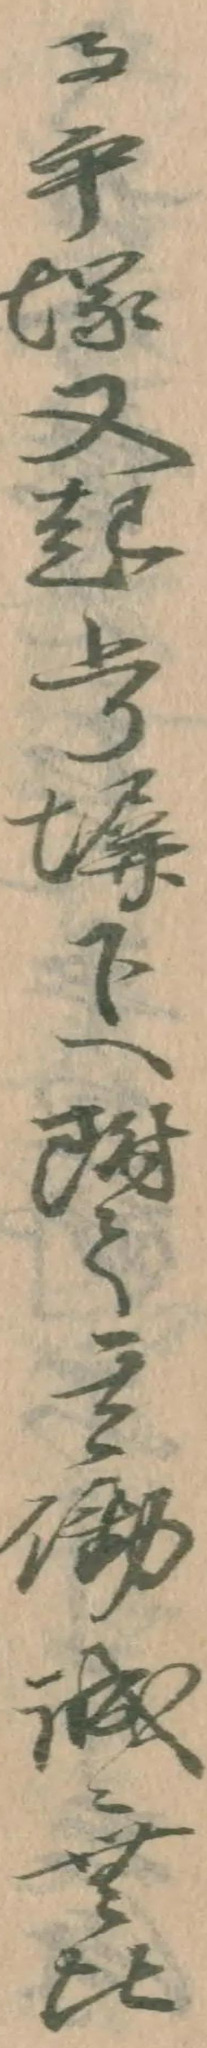る平塚又起上り塀下へ附て其働減に無比
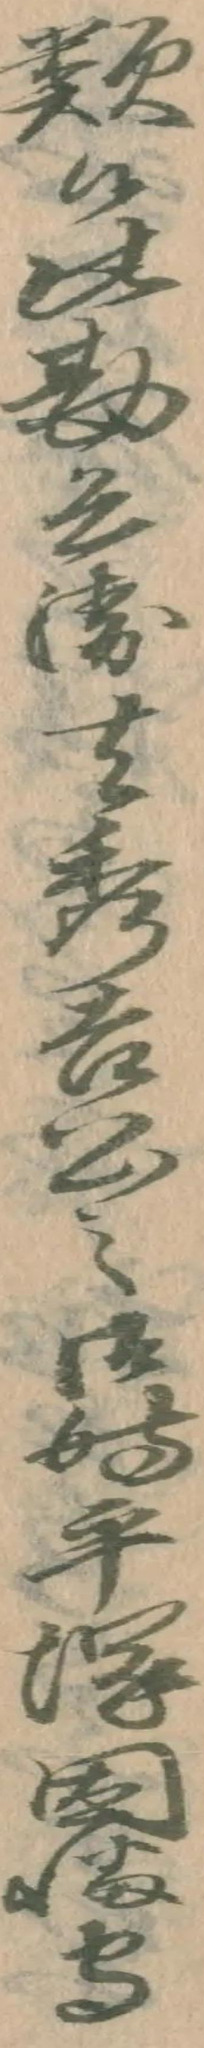類候此勘兵衛者秀吉公之御時平塚因幡守
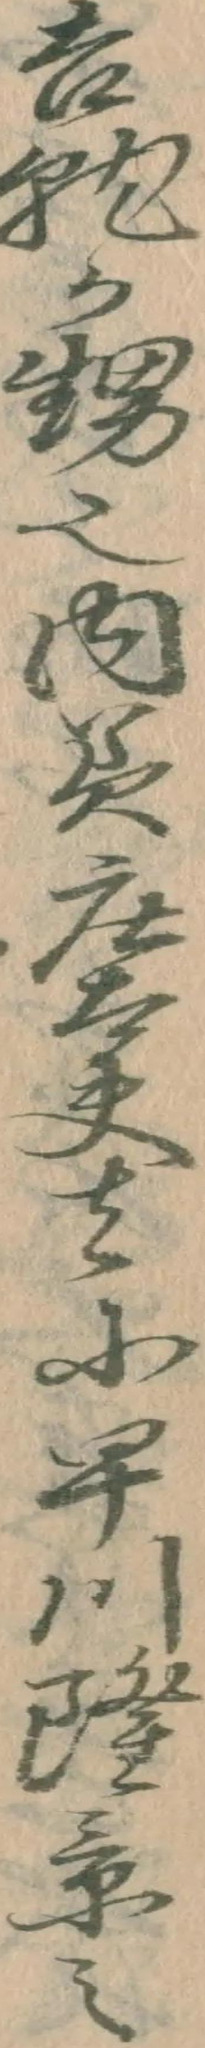吉就か甥也内美庄太夫者古早川隆景之
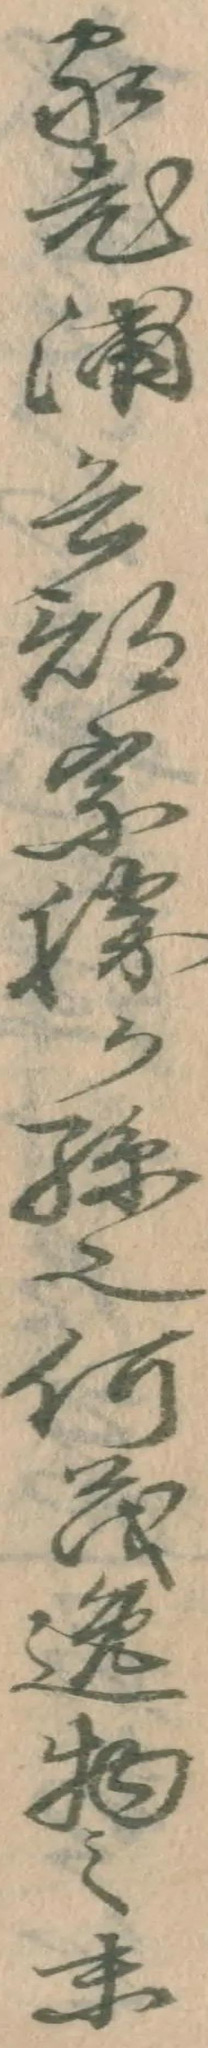家老浦兵部宗勝か孫也何茂逸物之末
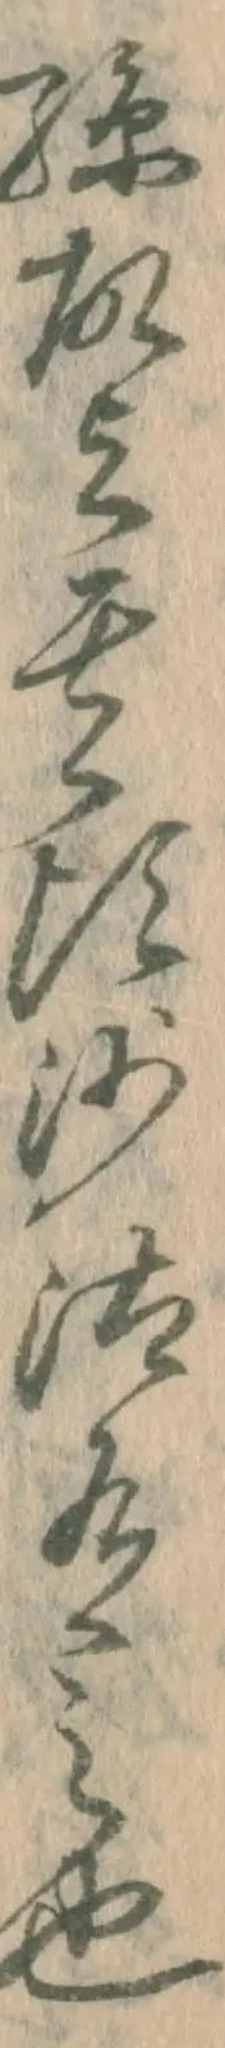孫故与其頃沙汰有之也
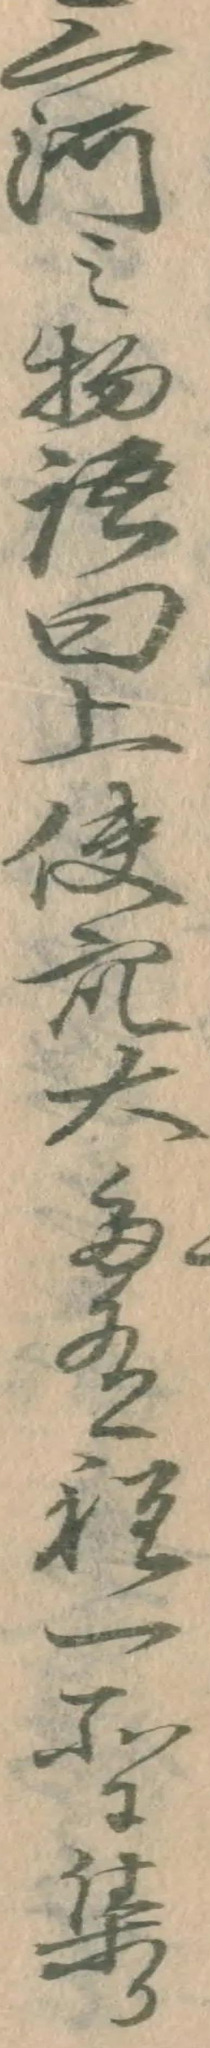三河之物語曰上使衆大多有程一所尓集り
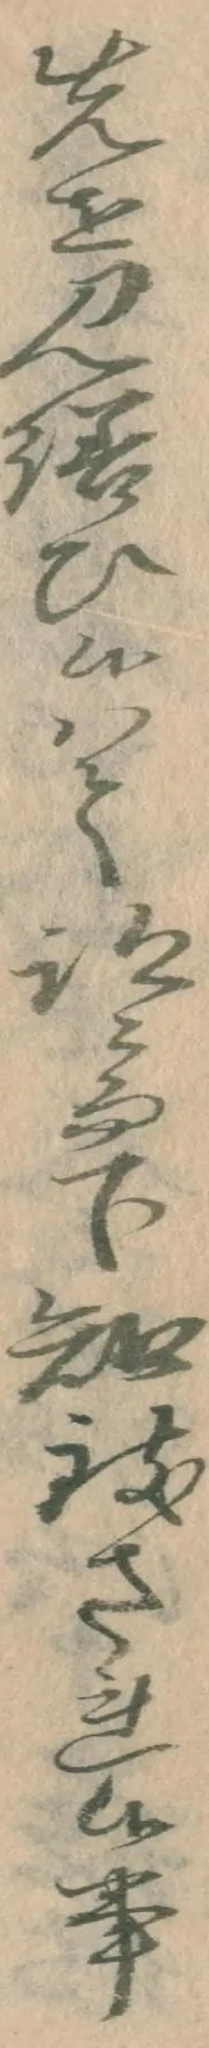先を見繕ひ候はて跡に而下知致さ連候事
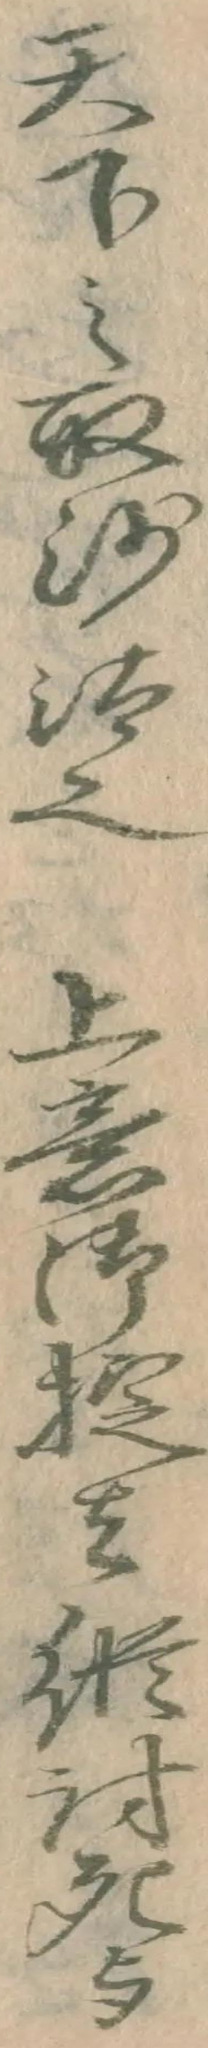天下之取沙汰也上意御掟者縦討死与
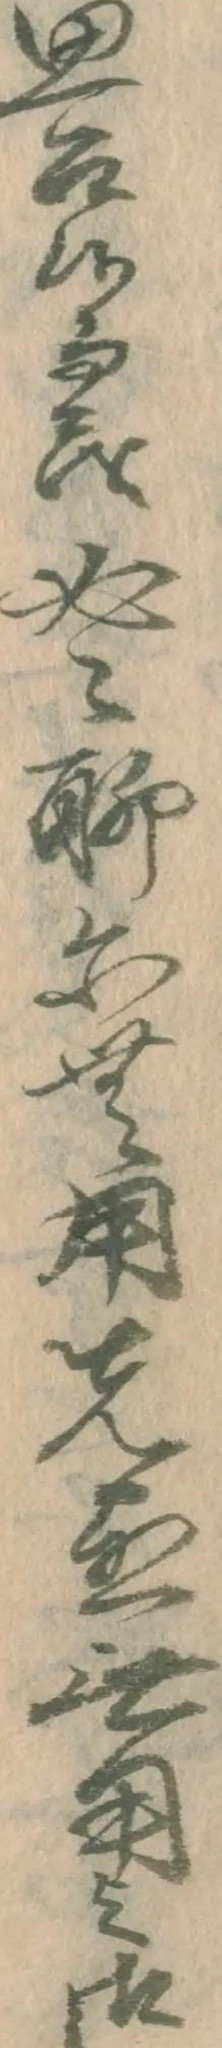思召候而茂必々聊尓無用先懸無用与御

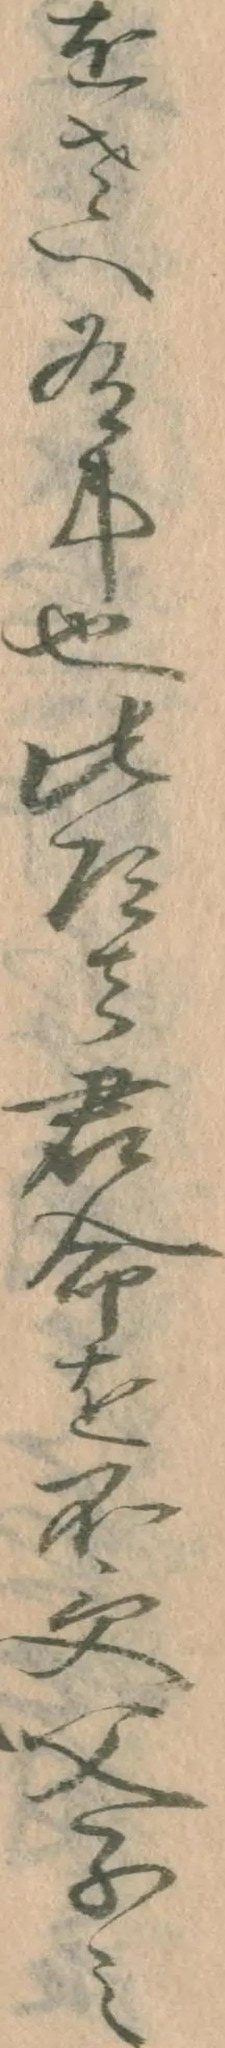をさへ有事也此道者君命を不受父子之
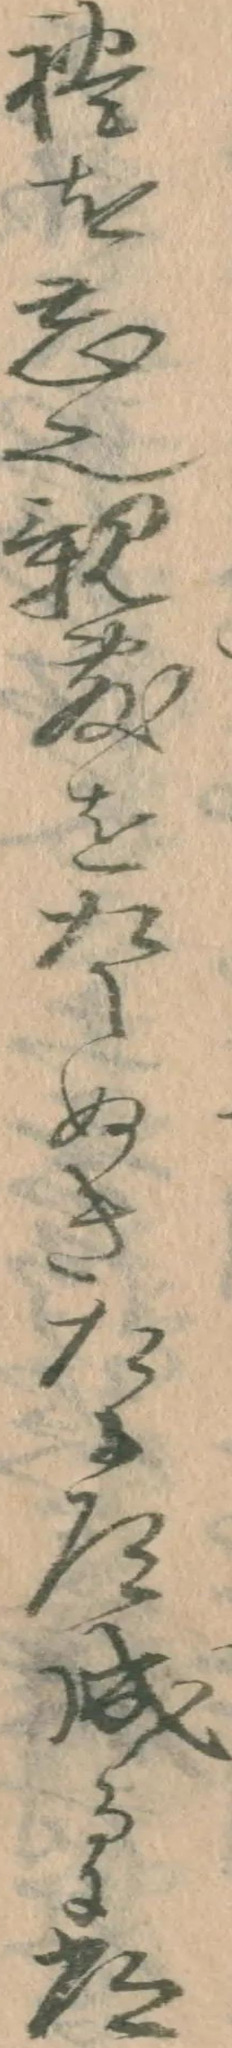禮を忘也親敷をたしぬきたる道成る尓常
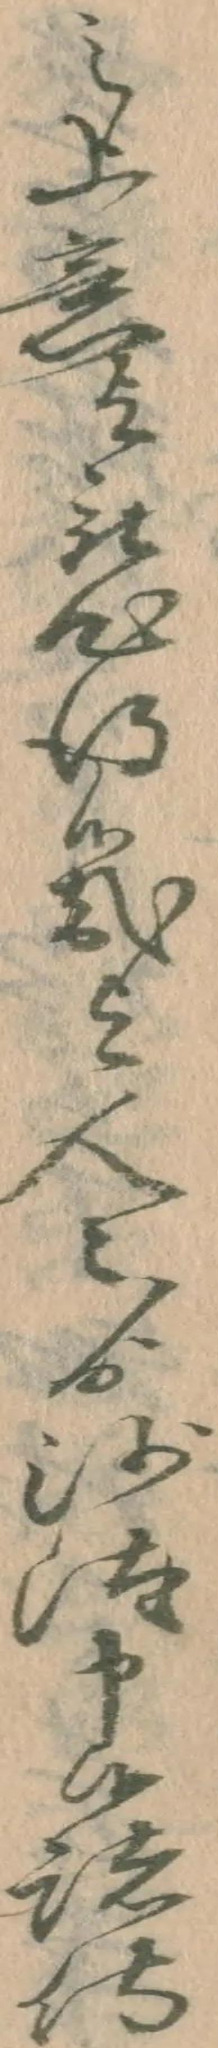之上意与被心得候哉与人々ゟ沙汰申候諸将
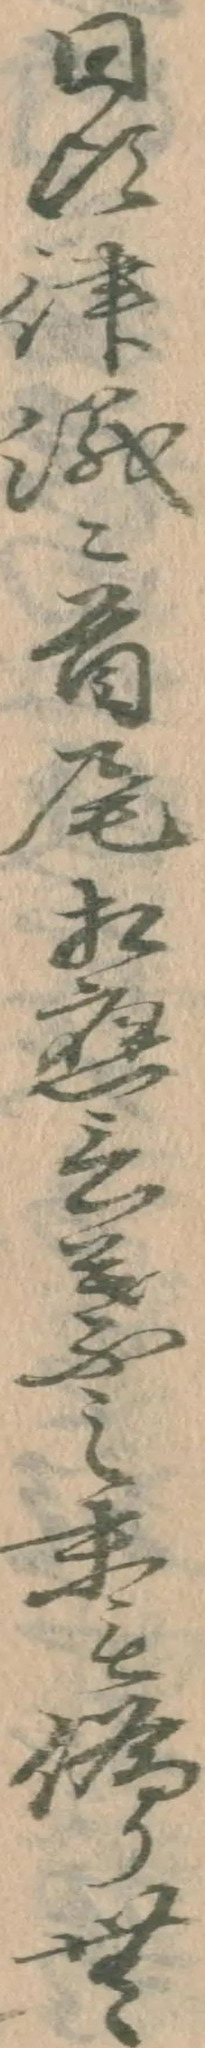日頃律儀に首尾相応言葉之末も偽り無
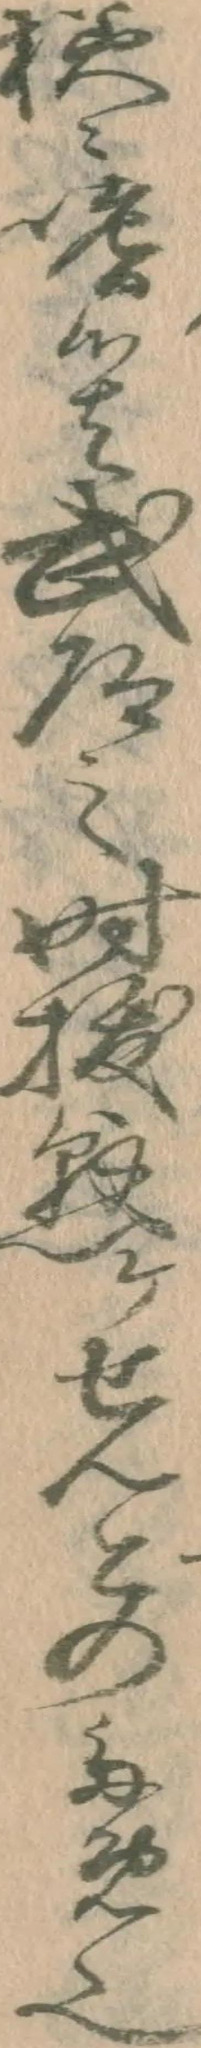様に嗜候者武道之時抜懸けせんとの多免也
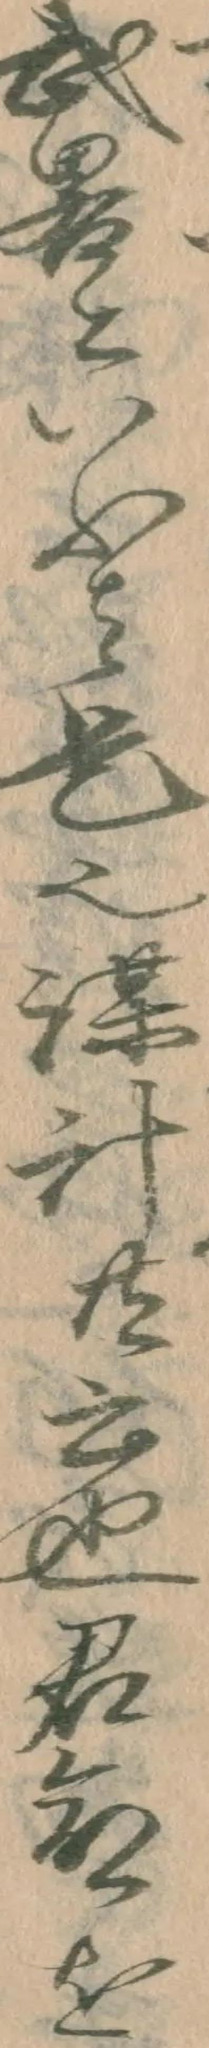武畧といふ者是也謀計共云也君命を
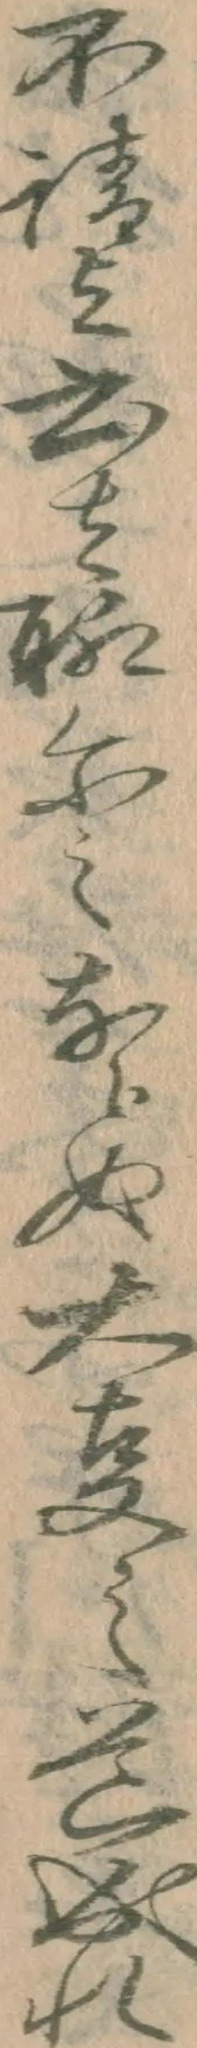不請与云者聊尓之ならぬ大事之是成れ
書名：切支丹御退治記 49巻. [8]
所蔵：国立国会図書館 National Diet Library, JAPAN
